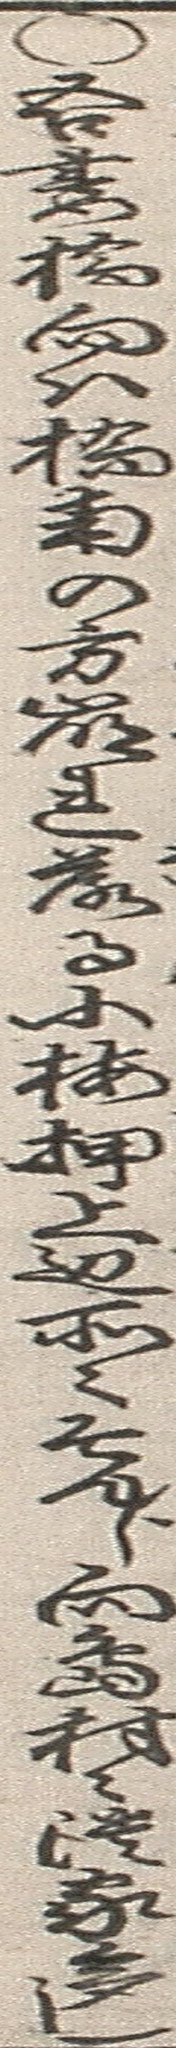◯吾妻橋向ハ橋南の方崩れ落る小梅押上辺所々そんじ向嶋村々潰家多し
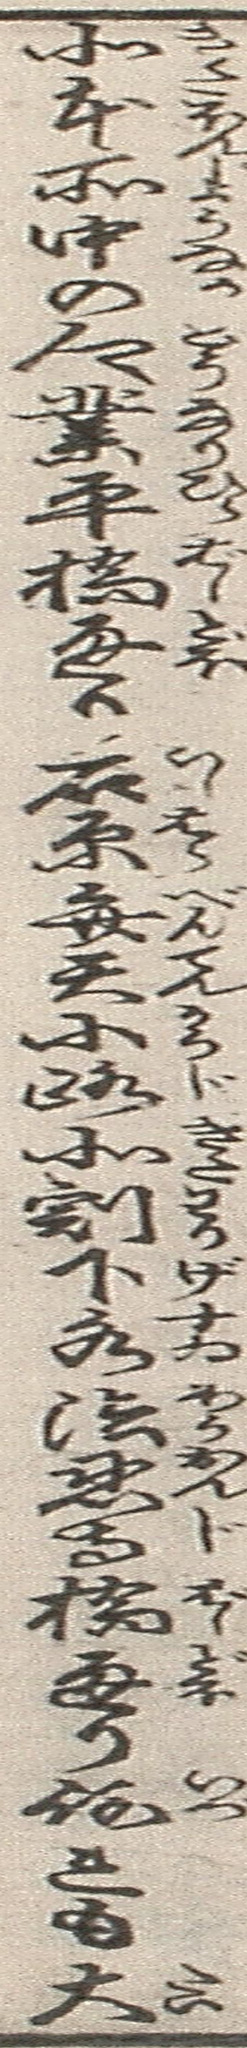北本所中の郷業平橋通り石原弁天小路北割下水法恩寺橋通り何れも大
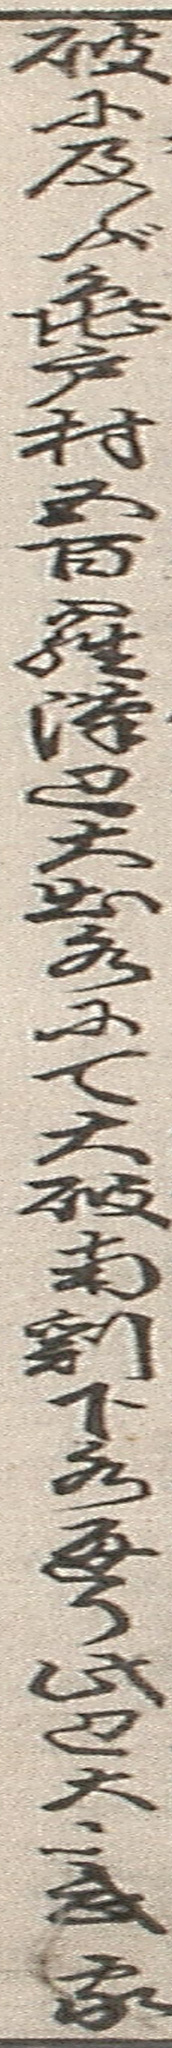破に及ぶ亀戸村五百羅漢辺大出水にて大破南割下水通り此辺大武家
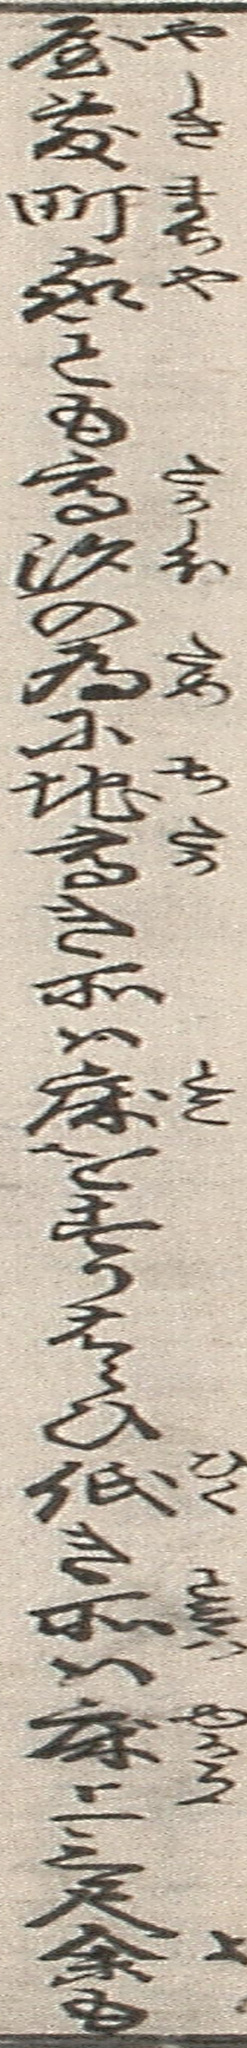屋敷町家とも高汐の為に地高き所ハ床をすりはらひ低き所ハ床上三尺余も
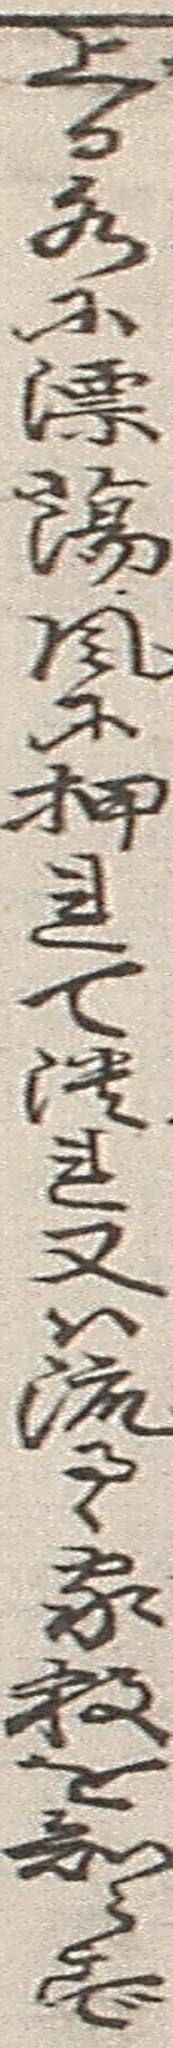上る水に漂蕩風に押れて潰れ又ハ流るゝ家数を知らず
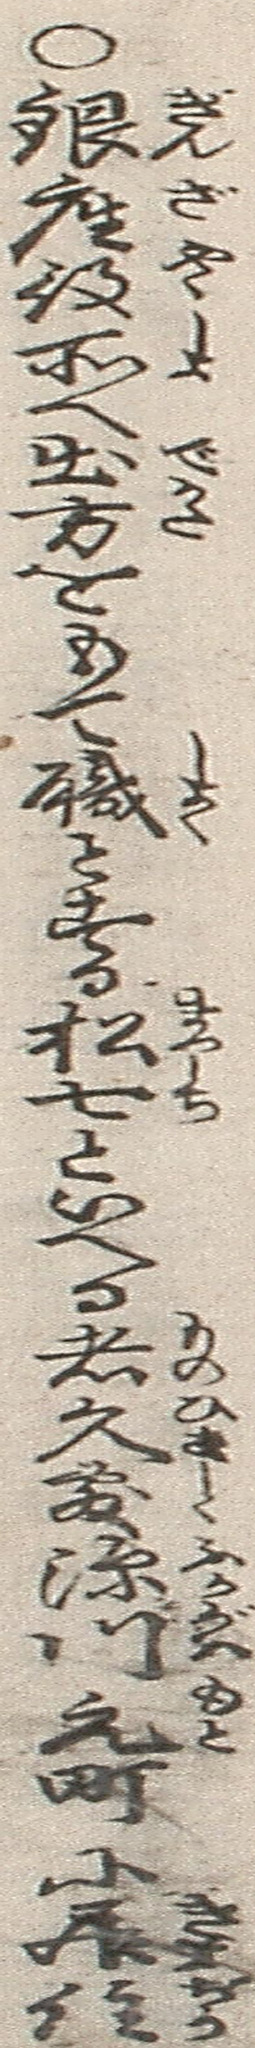◯銀座役所へ出方をもて職をする松七といへる者久敷深川元町に居住
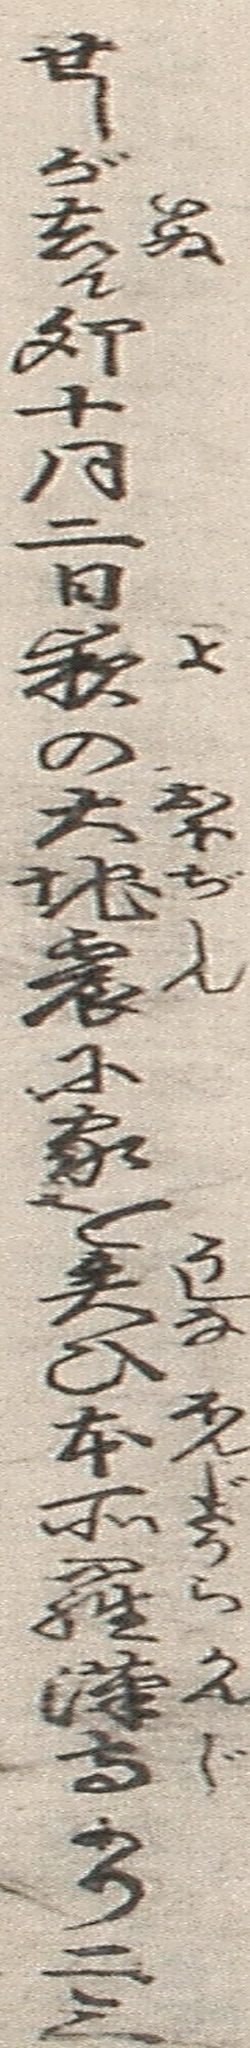せしが去ㇽ卯十月二日夜の大地震に家を失ひ本所羅漢寺より二三
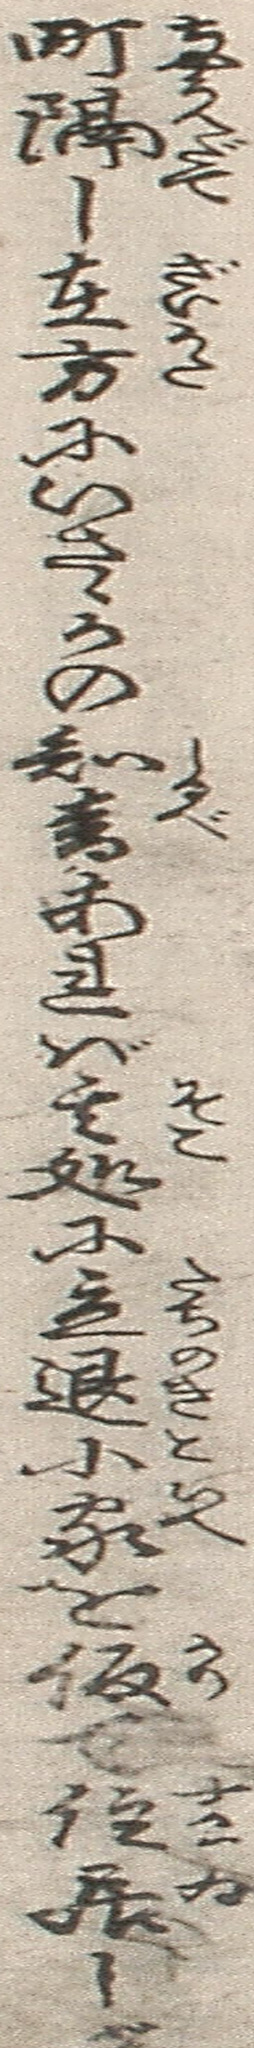町隔し在方にいさゝかの知音あれバ其処に立退小家を仮て住居しが
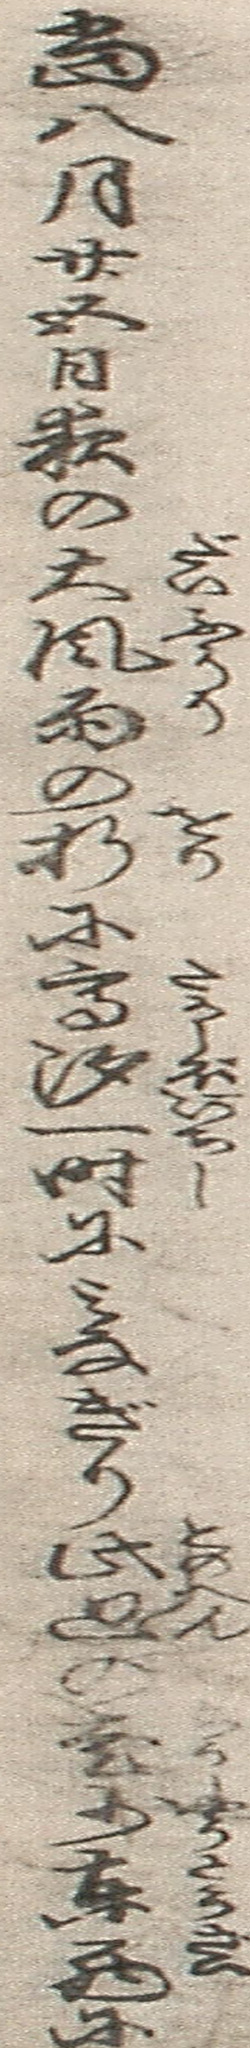当八月廿五日夜の大風雨の折に高汐一時にミなぎり此辺の老少東西に

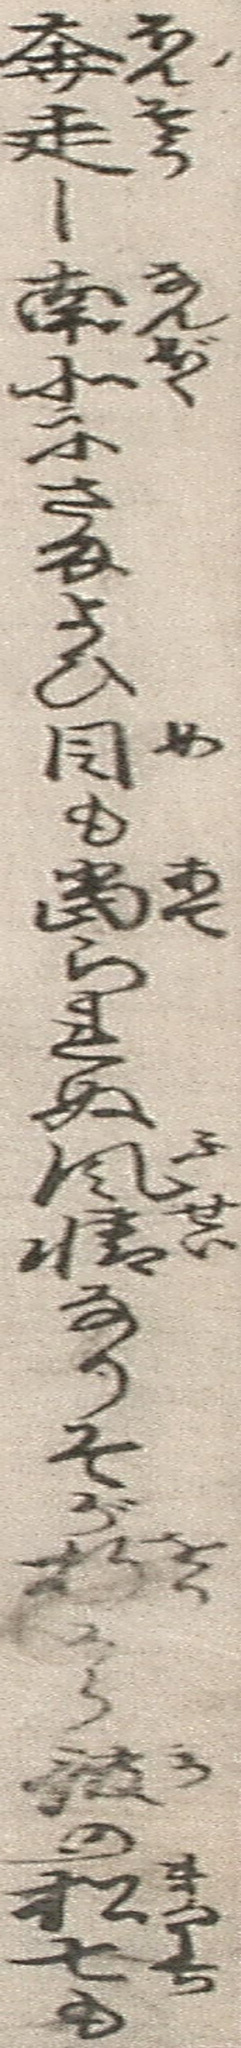奔走し南北にさまよひ目も当られぬ風情なりそが折から彼の松七も
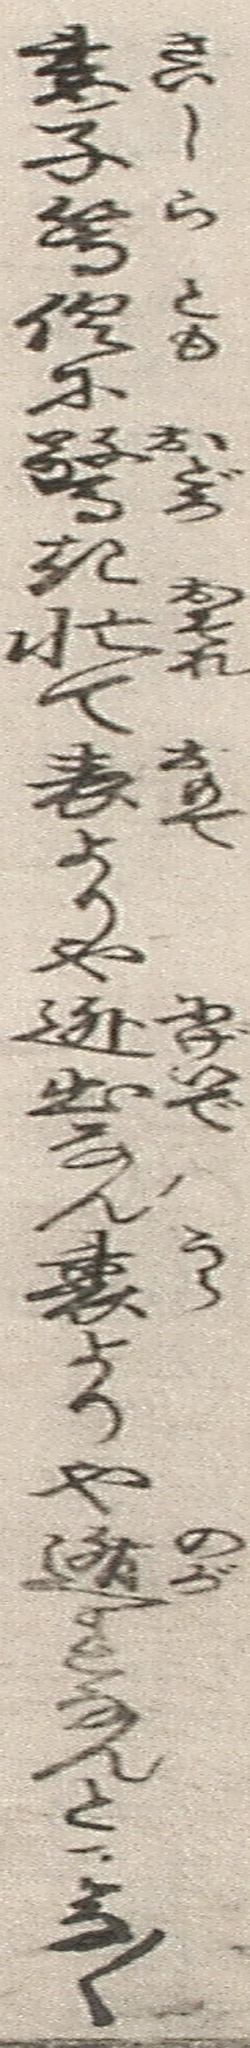妻子等倶に驚き忙て表よりや逃出なん裏よりや逃れなんところ〳〵
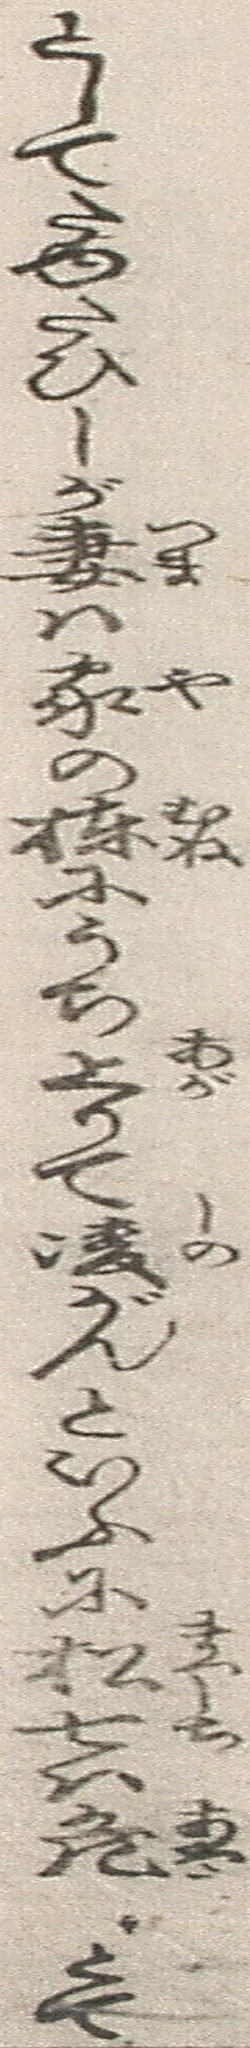としてたゆたひしが妻ハ家の棟にうち上りて凌がんといふに松七ハ危しとて
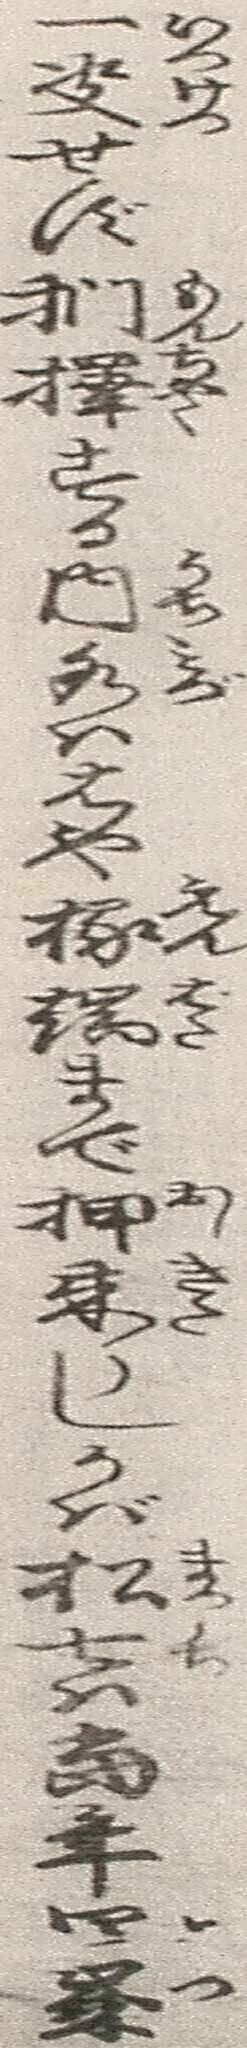一決せず捫擇する内水ハはや縁端まで押来りしかバ松七ハ当年四歳
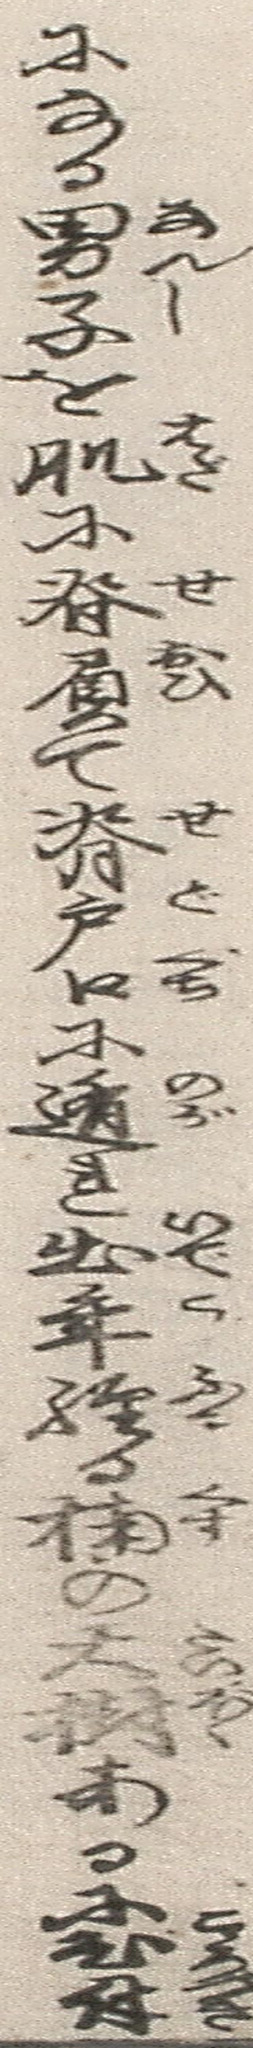になる男子を肌に背負て背戸口に遁れ出年経る楠の大樹あるに心付
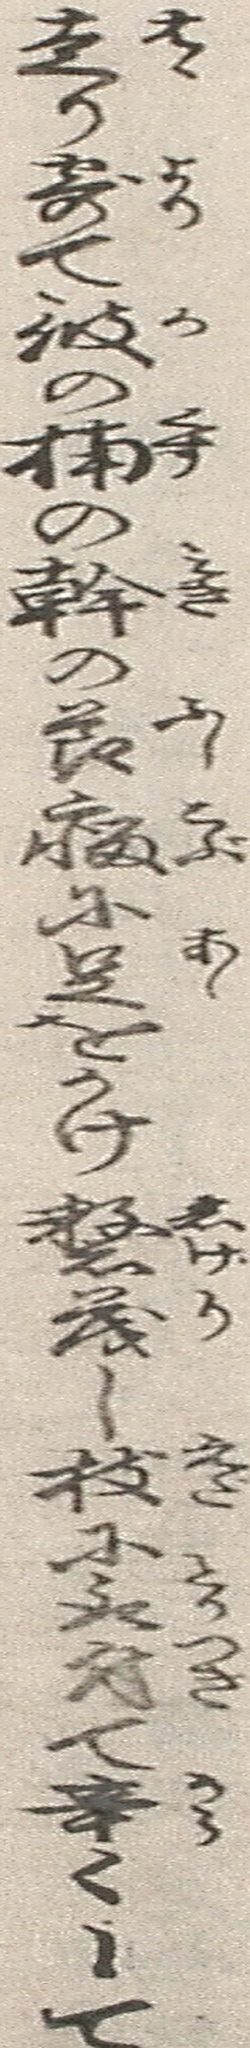走り寄て彼の楠の幹の節瘤に足をかけ整茂し枝に取付て辛くして
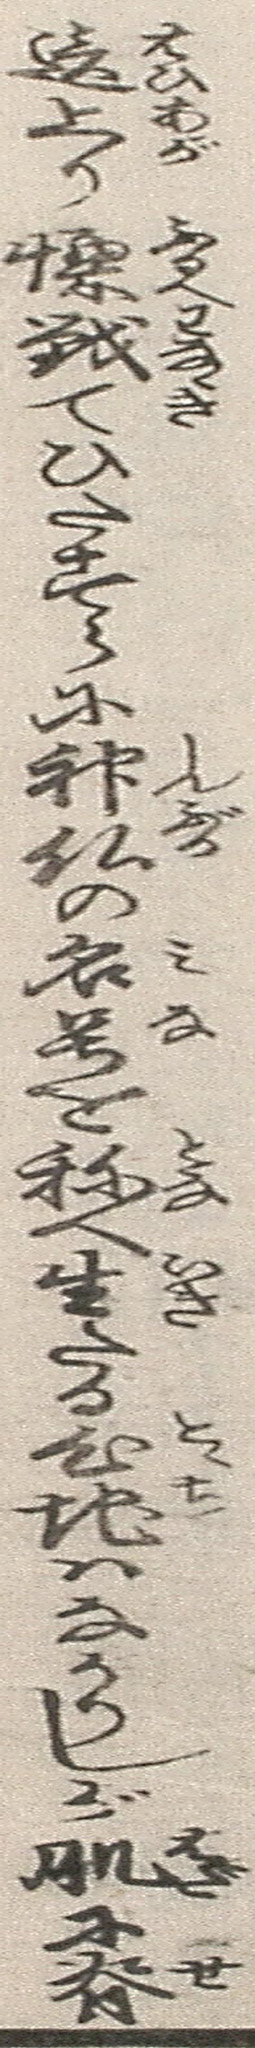這上り慄戦てひたすらに神仏の名号を称へ生たる心地ハなかりしが肌に背
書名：安政風聞集　上中下　全
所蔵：東京大学地震研究所図書室 Earthquake Research Institute Library, The University of Tokyo, JAPAN
